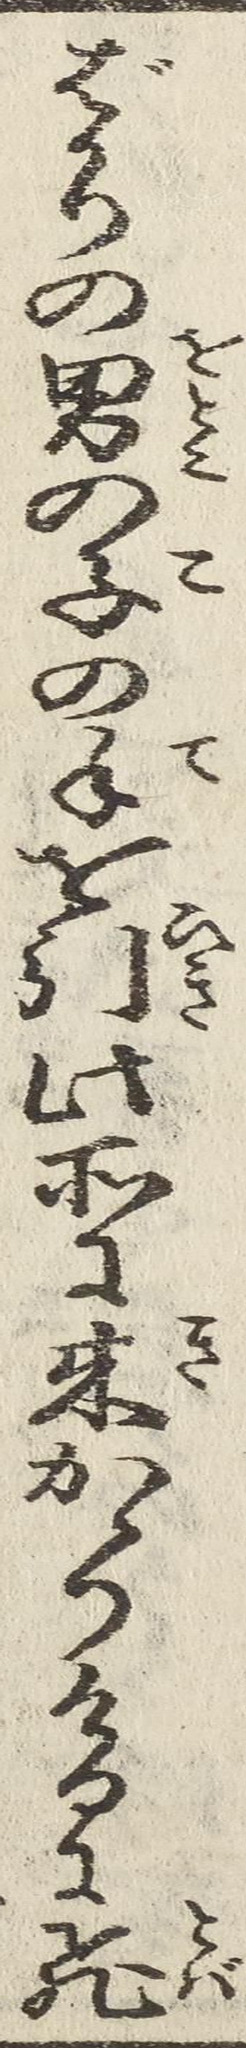ばかりの男の子の手を引此所に来かゝりけるに飛
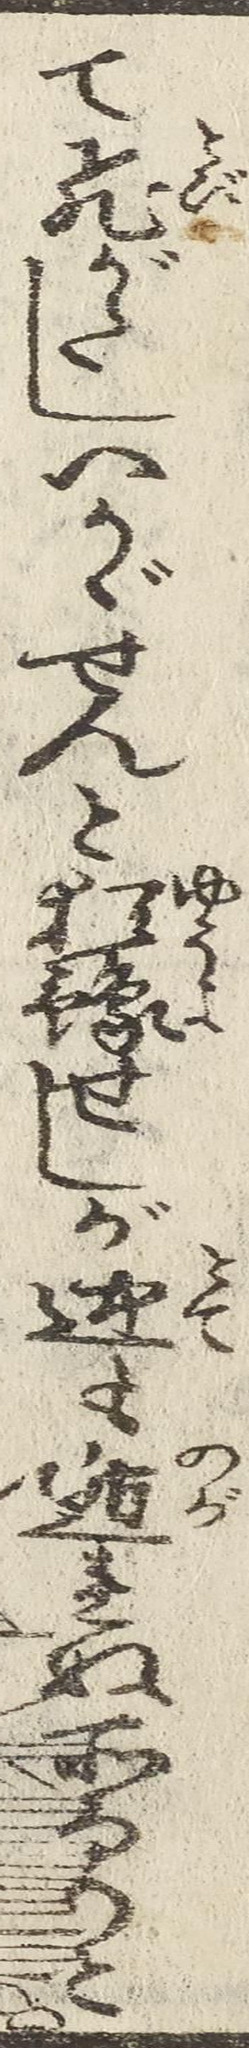て飛がたしいかゞせんと猶豫せしが迚も遁れぬ所なりと
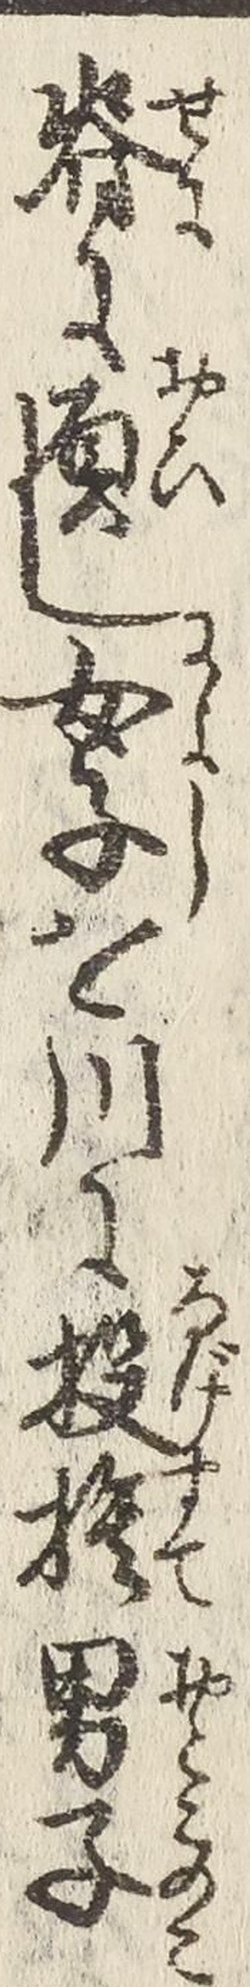背に負し女子を川に投捨男子
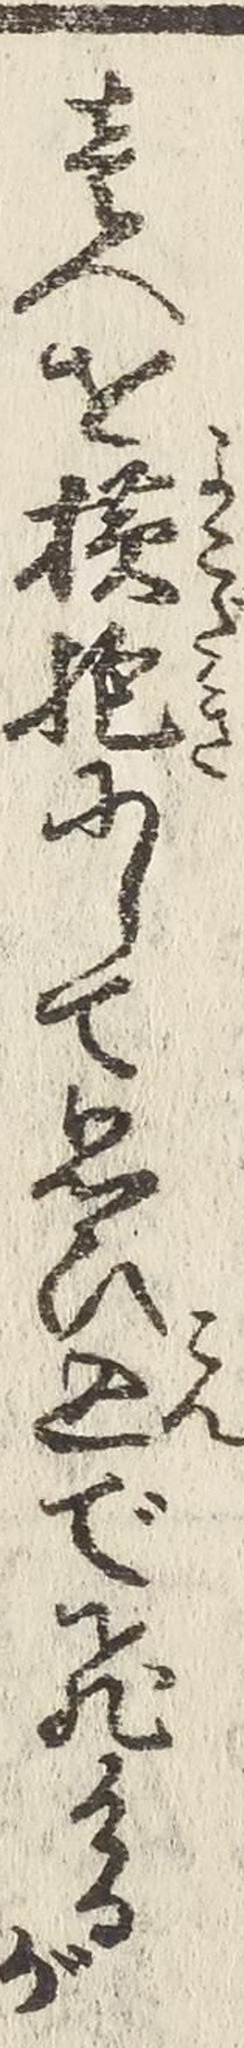壱人を横抱にして思ひ込で飛けるが
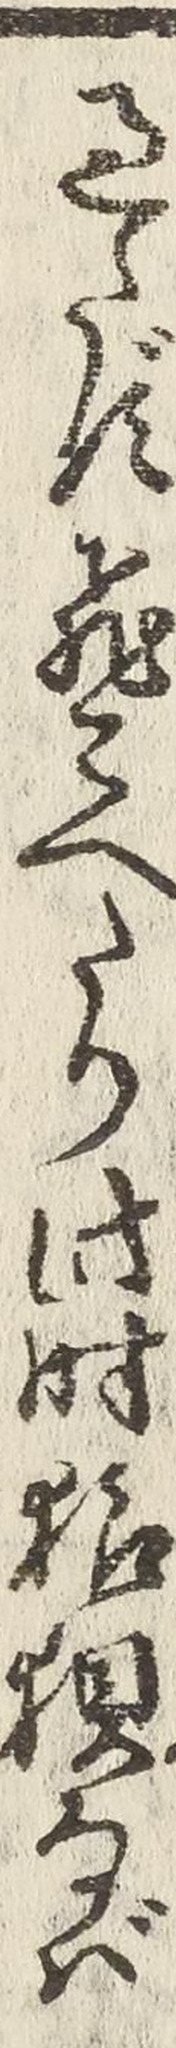過たず飛こへたり此時狼狽なば
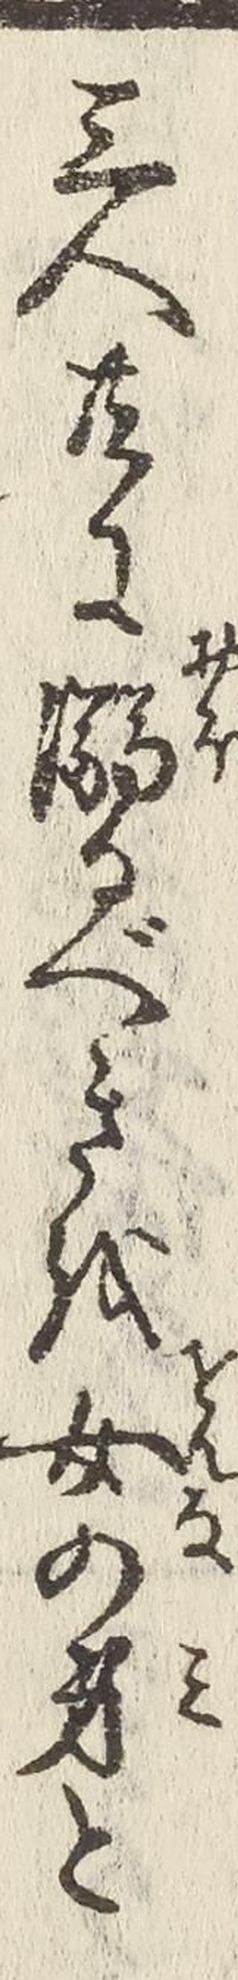三人共に溺るべきを女の身と
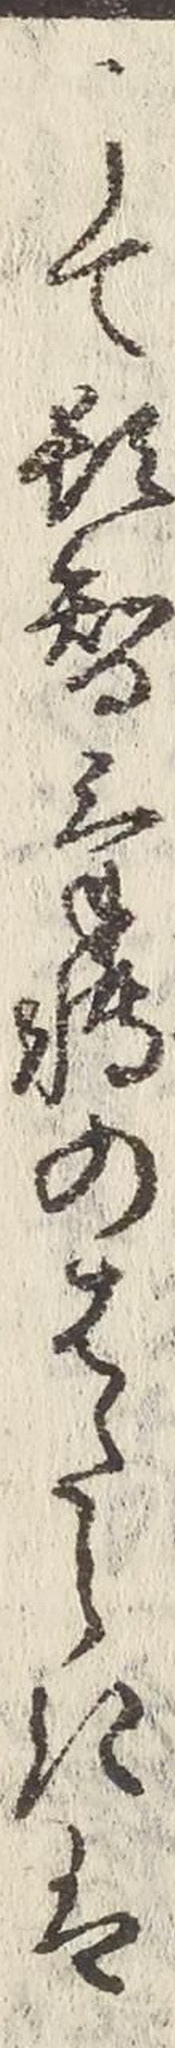して頓智気転のはたらきは
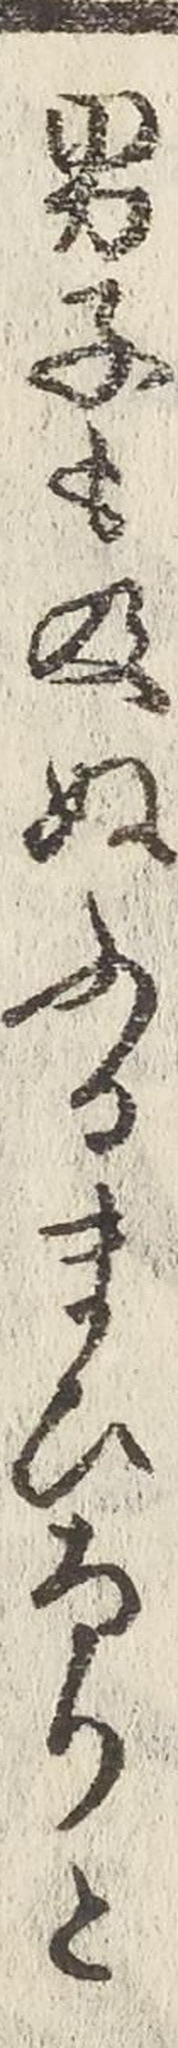男子も及ぬふるまひなりと
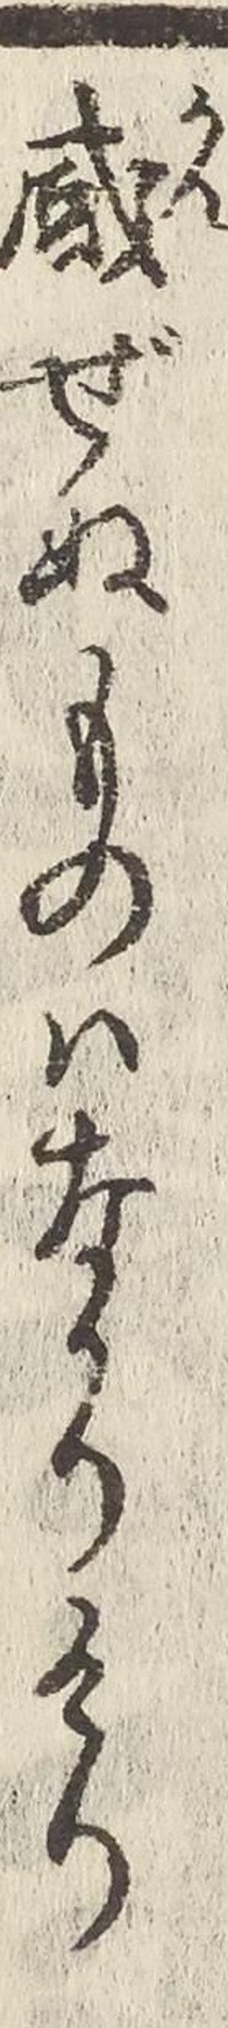感ぜぬものはなかりけり

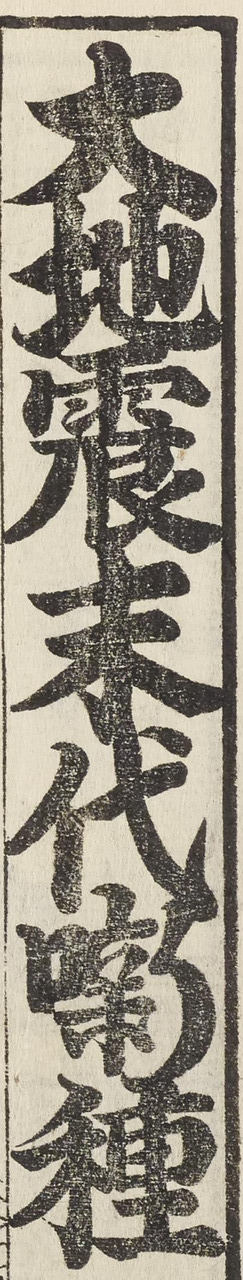大地震末代噺種
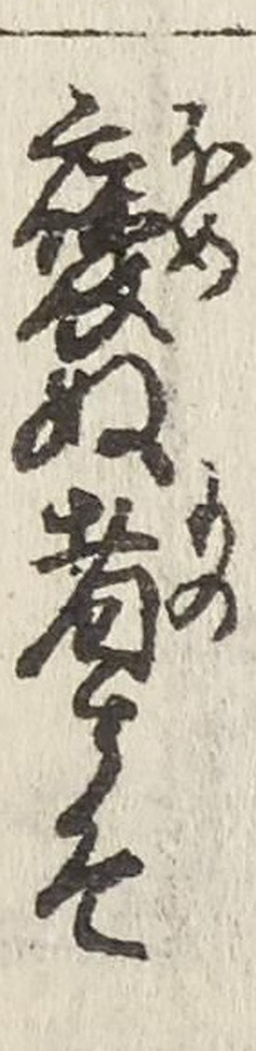褒ぬ者こそ
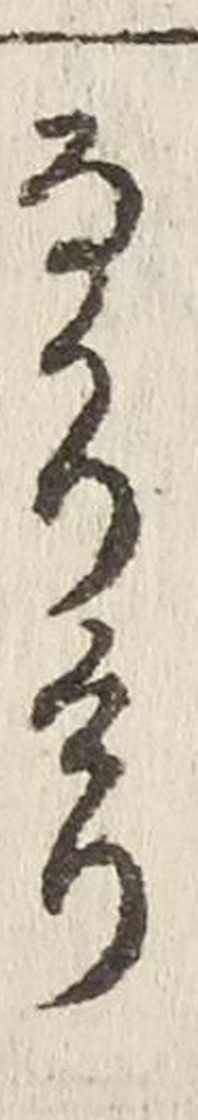なかりけり
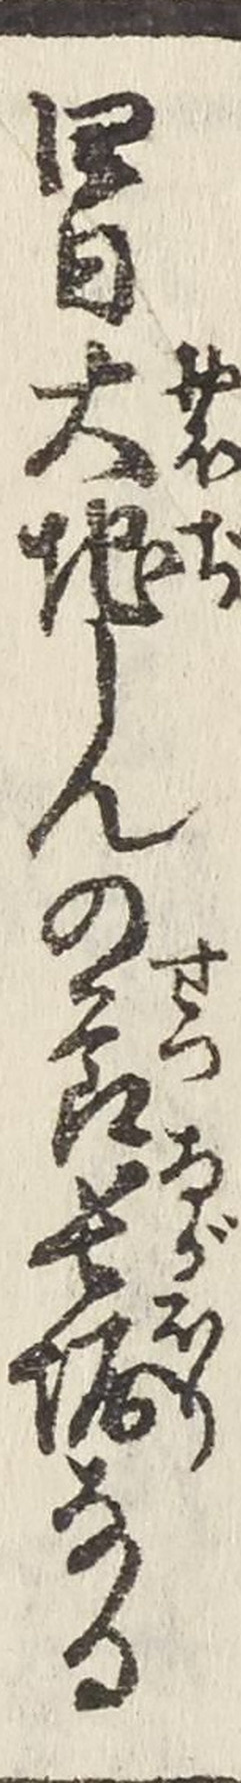四日大地しんの節長堀なる
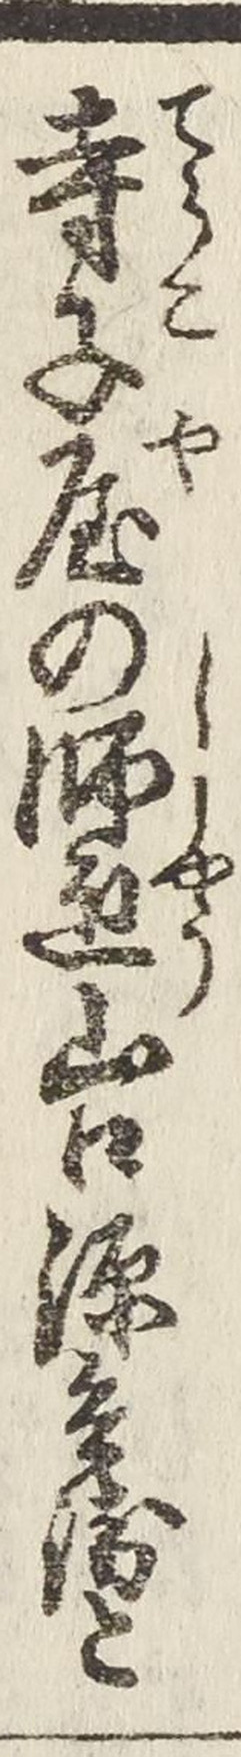寺子屋の師匠山口源兵衛と
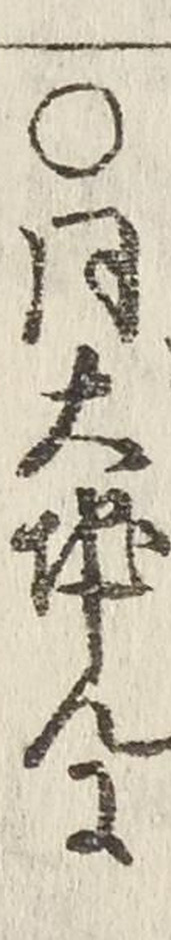○同大地しんに
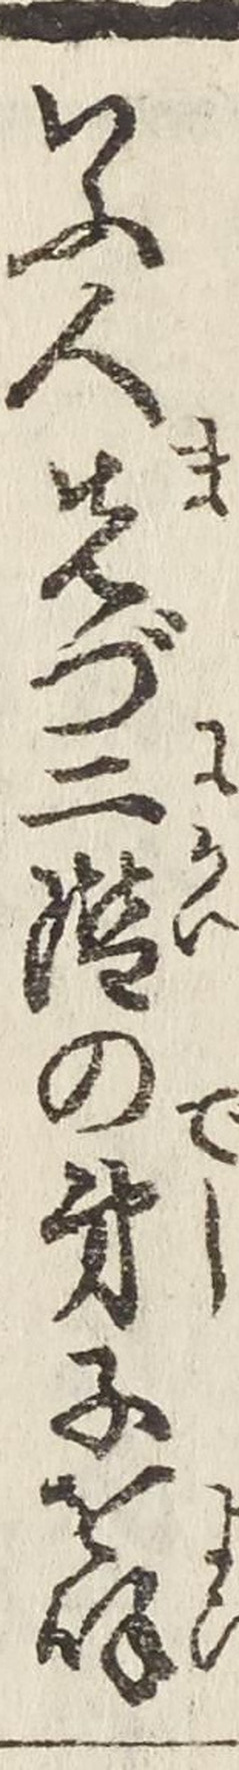いふ人先づ二階の弟子を呼
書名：大地震大（津浪）末代噺（の）種　三編全
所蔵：東京大学地震研究所図書室 Earthquake Research Institute Library, The University of Tokyo, JAPAN
